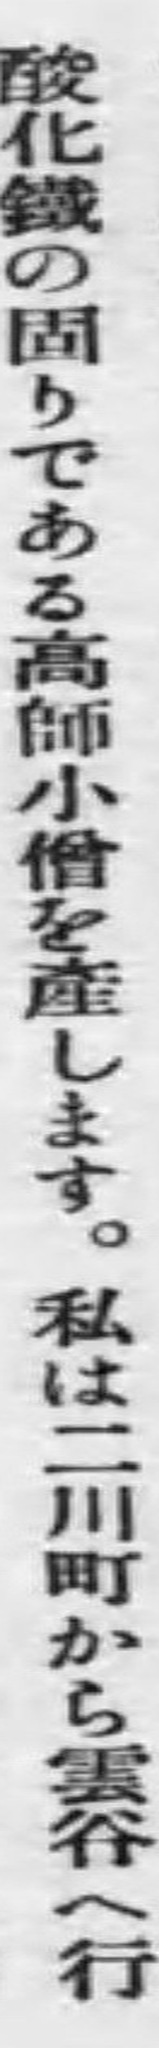酸化鉄の固りである高師小僧を産します。私は二川町から雲谷へ行
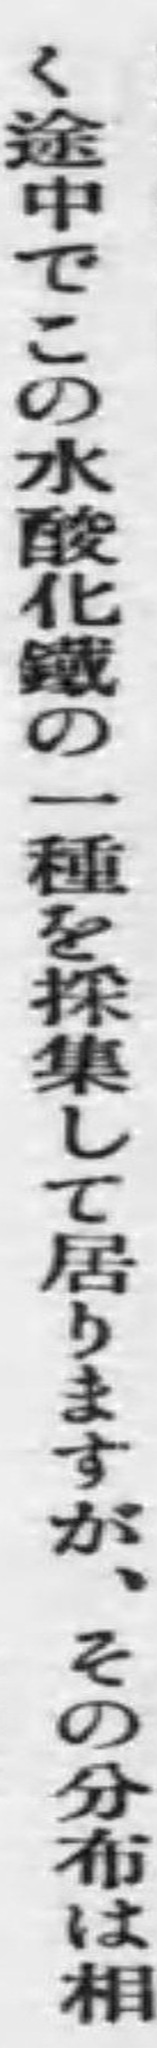く途中でこの水酸化鉄の一種を採集して居りますが、その分布は相
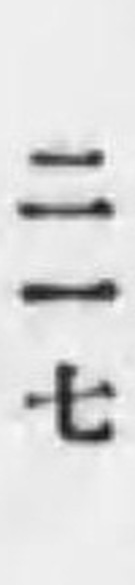二一七

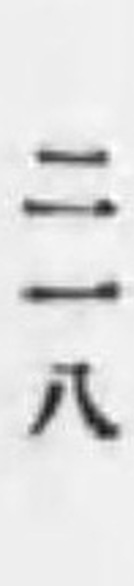二一八
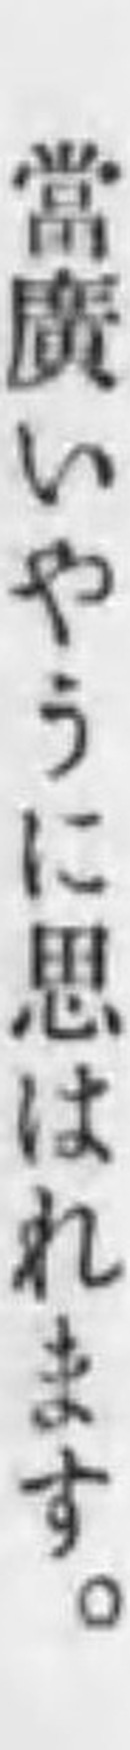当広いやうに思はれます。
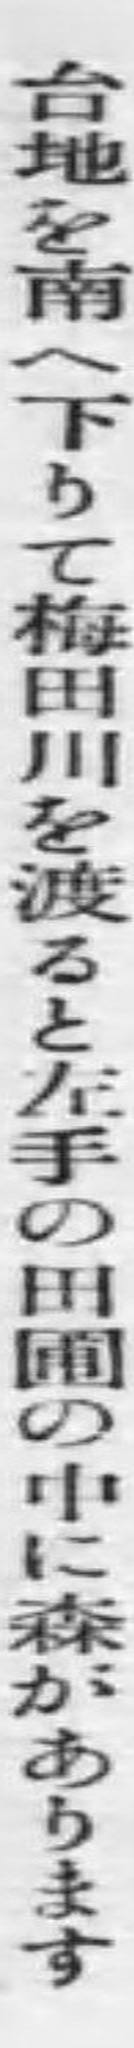台地を南へ下りて梅田川を渡ると左手の田圃の中に森があります
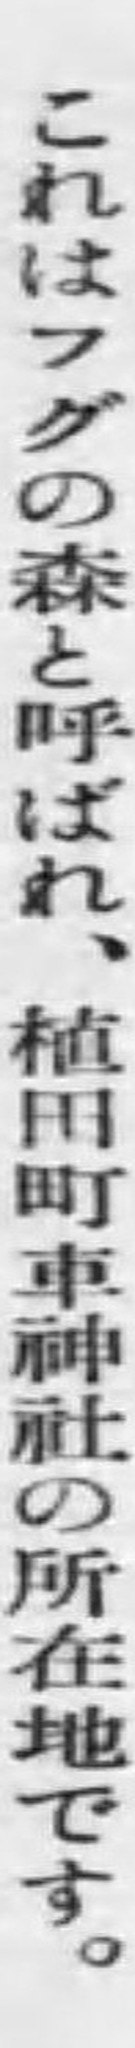これはフグの森と呼ばれ、植田町車神社の所在地です。
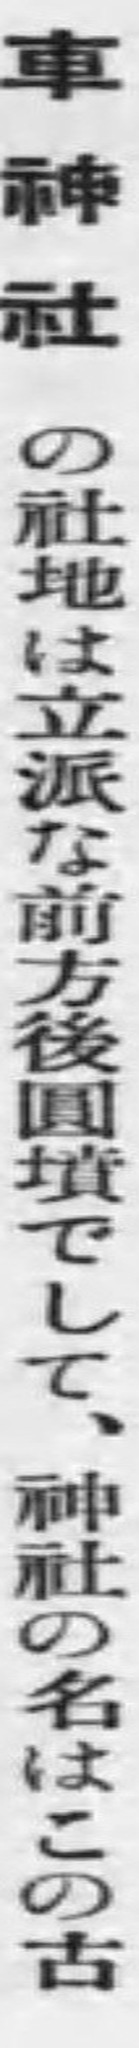車神社の社地は立派な前方後円墳でして、神社の名はこの古
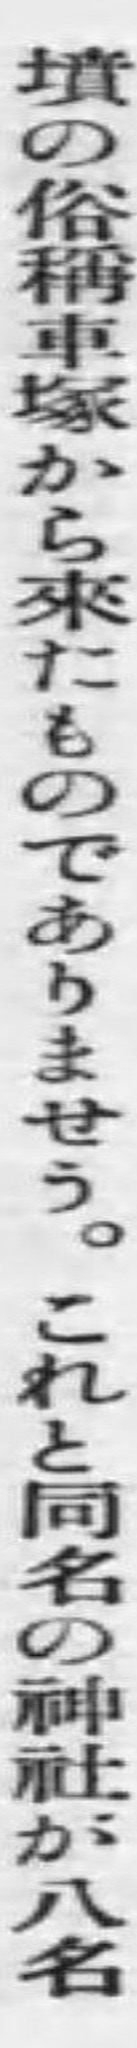墳の俗称車塚から来たものでありませう。これと同名の神社が八名
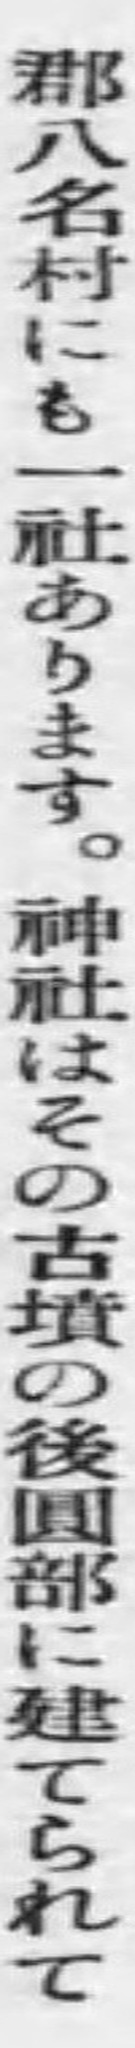郡八名村にも一社あります。神社はその古墳の後円部に建てられて
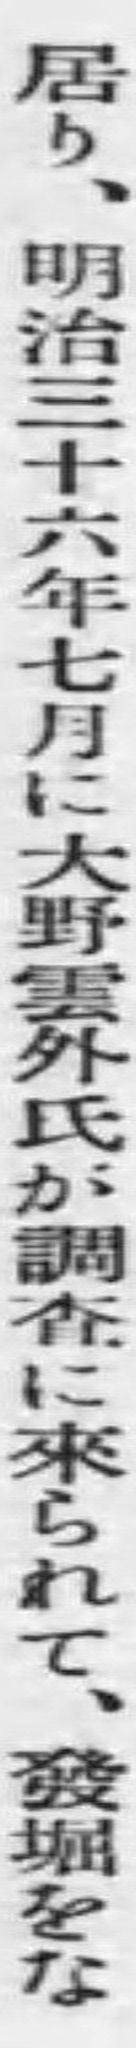居り、明治三十六年七月に大野雲外氏が調査に来られて、発堀をな
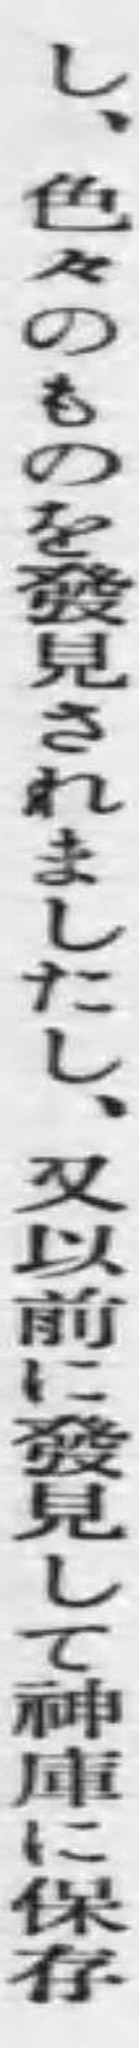し、色々のものを発見されましたし、又以前に発見して神庫に保存
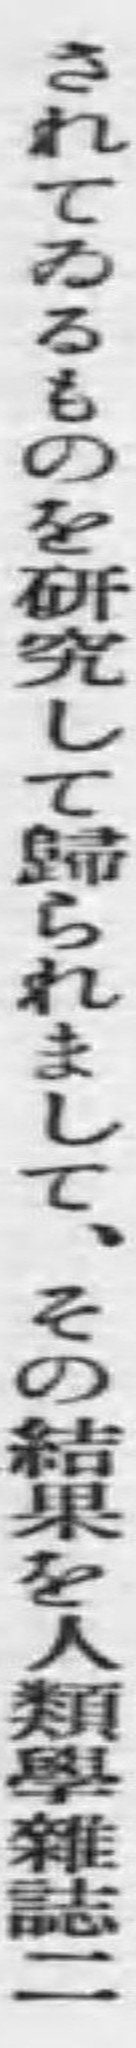されてゐるものを研究して帰られまして、その結果を人類学雑誌二
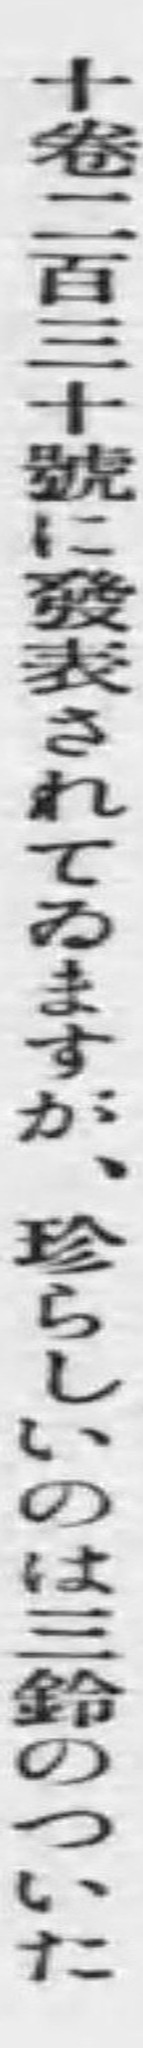十巻二百三十号に発表されてゐますが、珍らしいのは三鈴のついた
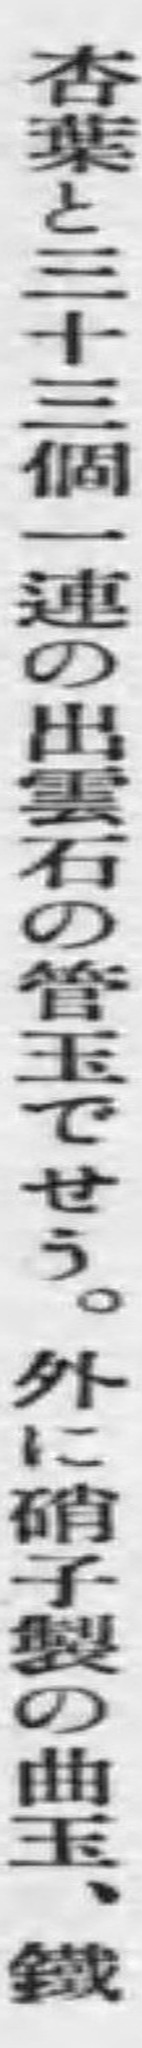杏葉と三十三個一連の出雲石の管玉でせう。外に硝子製の曲玉、鉄
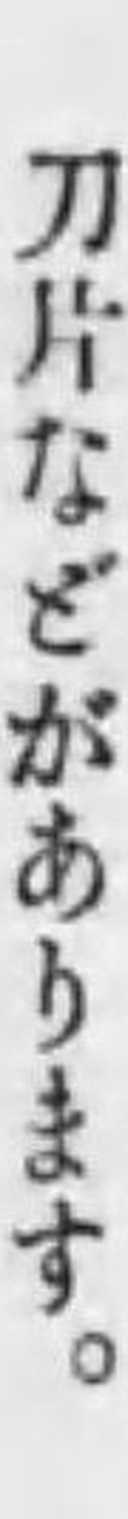刀片などがあります。
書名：東三河道中記 : 豊橋市及其附近案内
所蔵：国立国会図書館 National Diet Library, JAPAN
